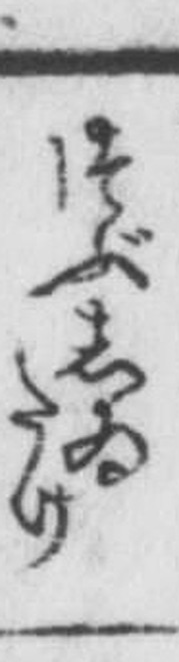つぶしい
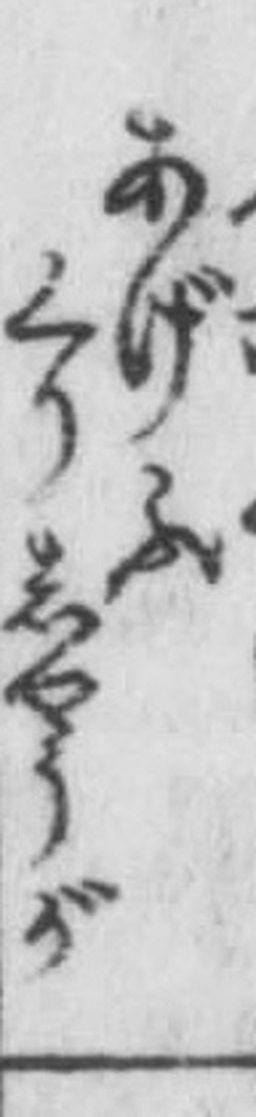くりしやうが

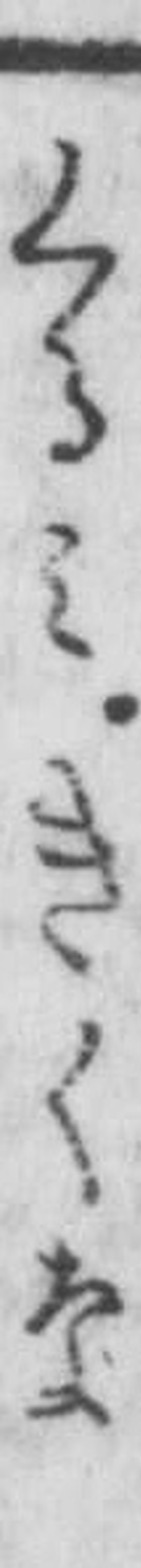くるミきくな
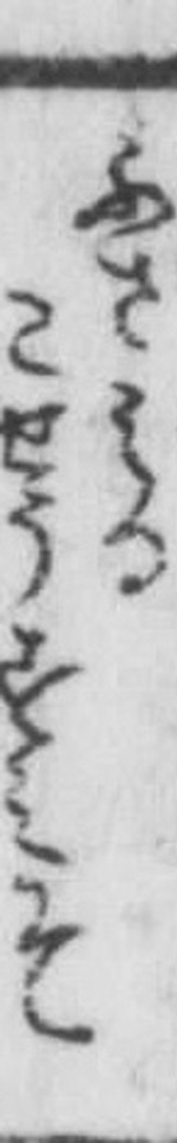こせうミそ
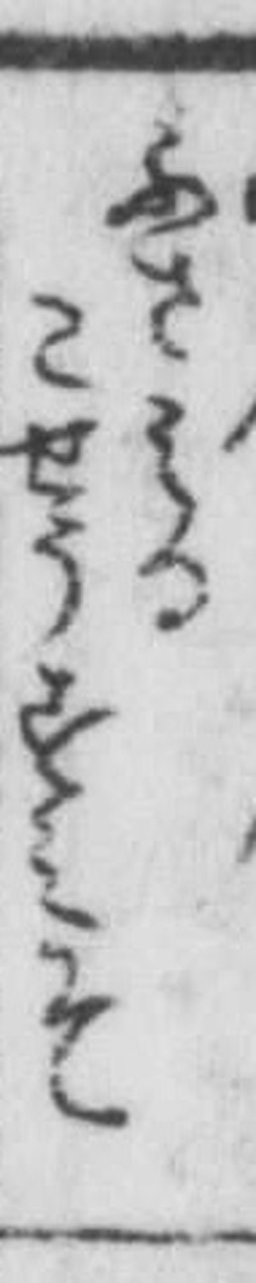こせうミそ
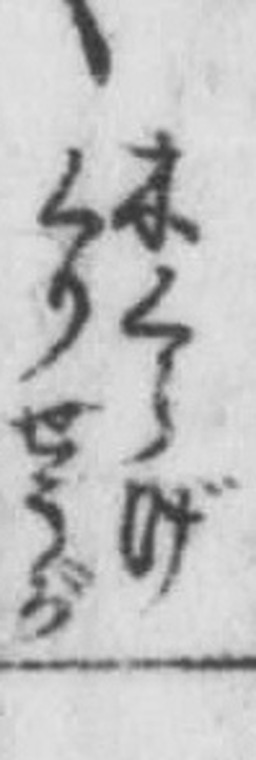くりせうが
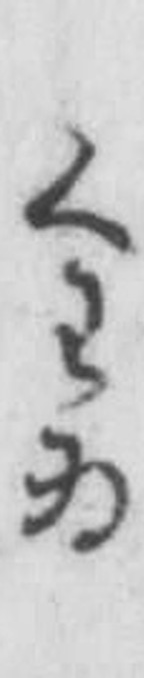くわゐ
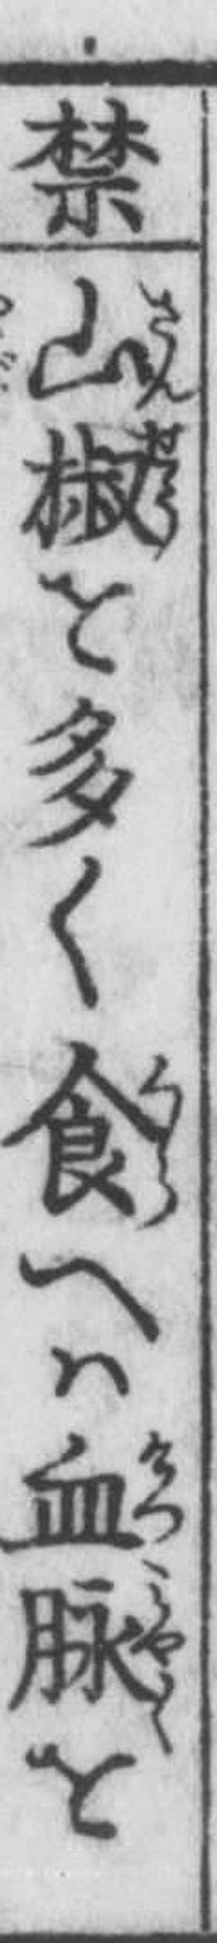禁山椒を多く食へハ血脈を
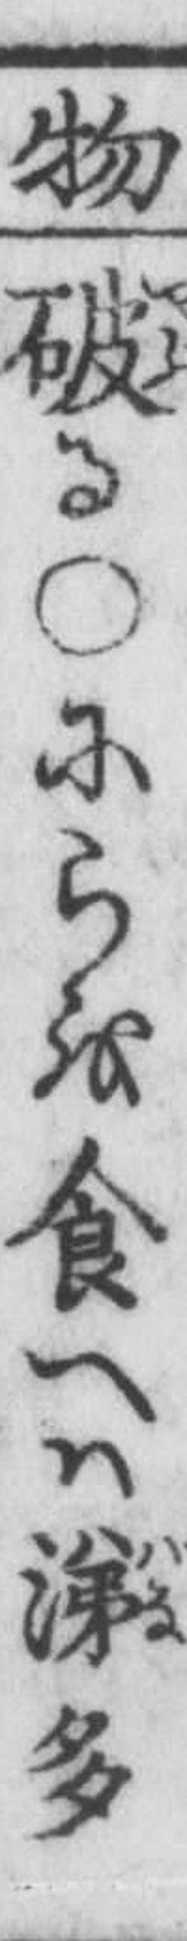物破る〇にらを食へハ洟多
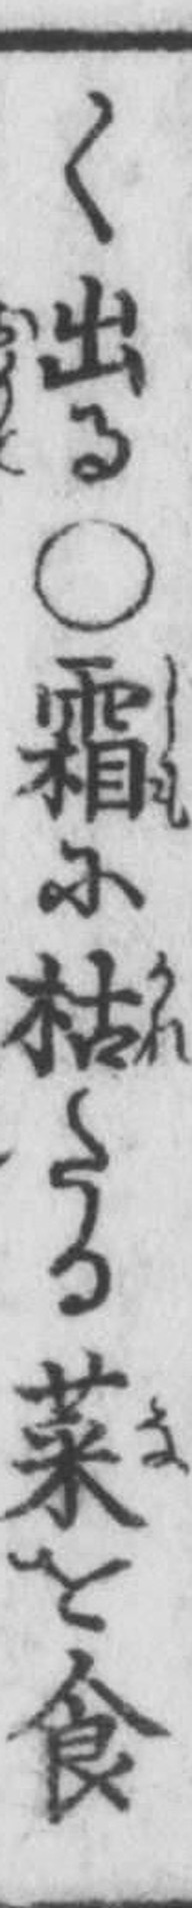く出る〇霜に枯たる菜を食
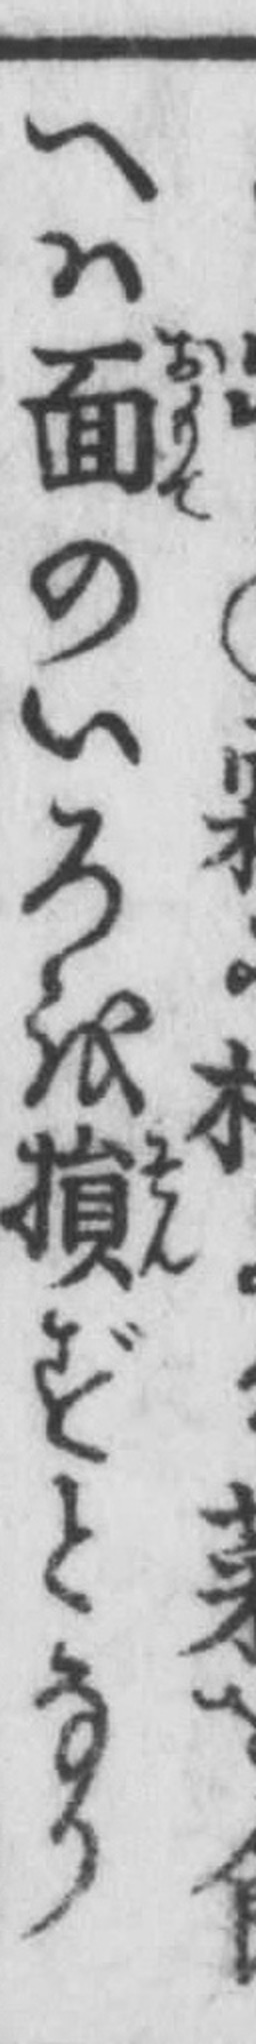へハ面のいろを損ずとなり
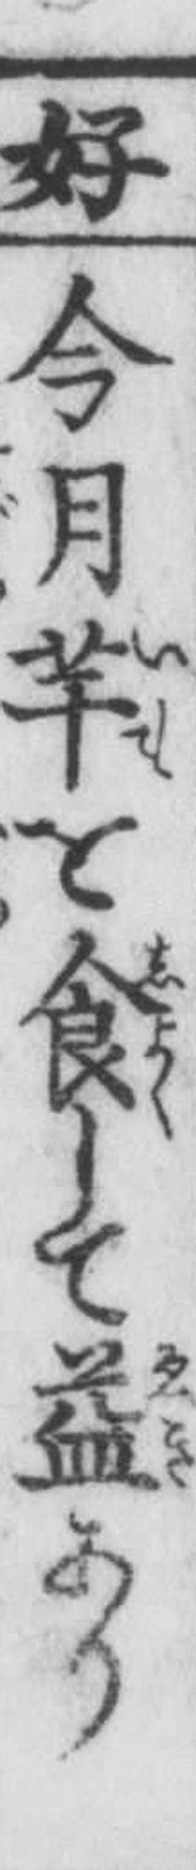好今月芋を食して益あり
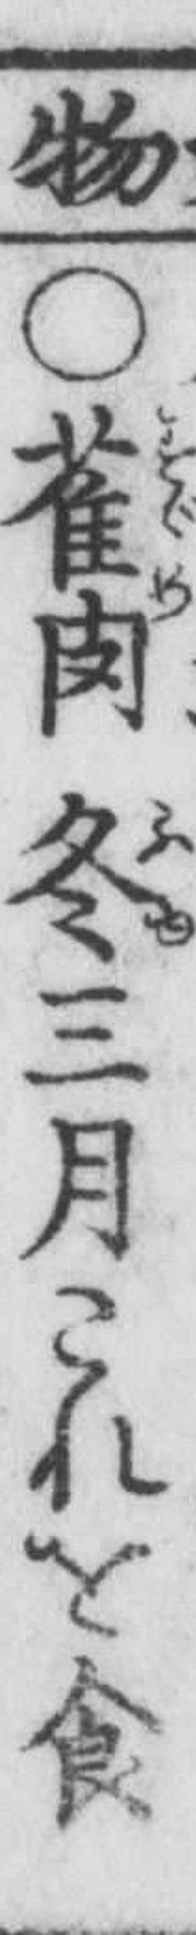物〇萑肉冬三月これを食
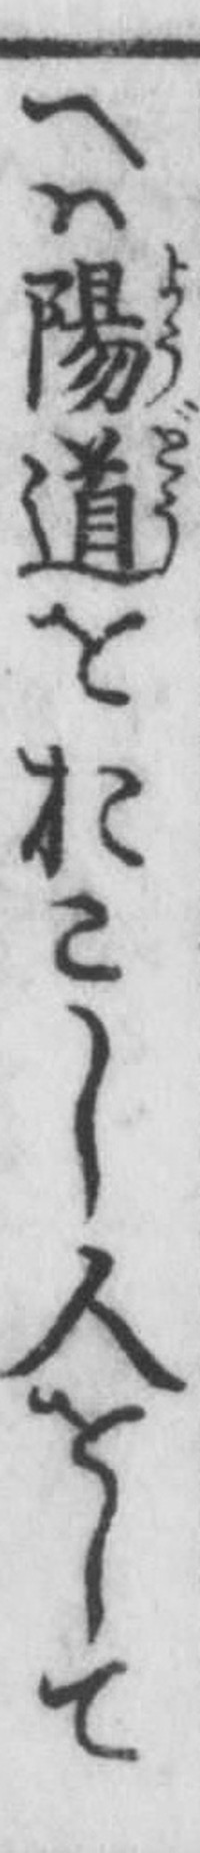へハ陽道ををおこし人をして
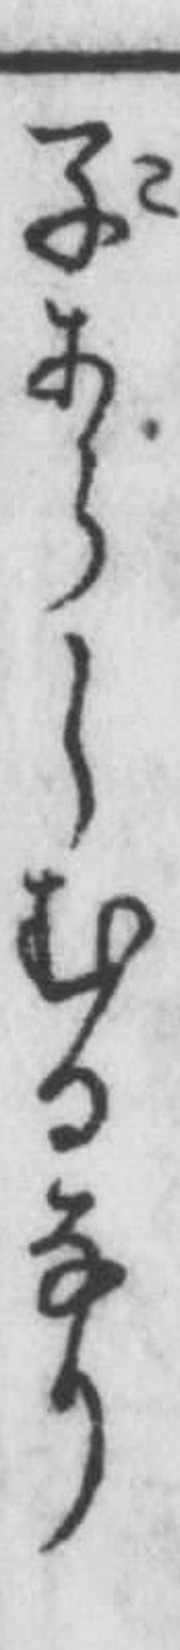子あらしむるなり
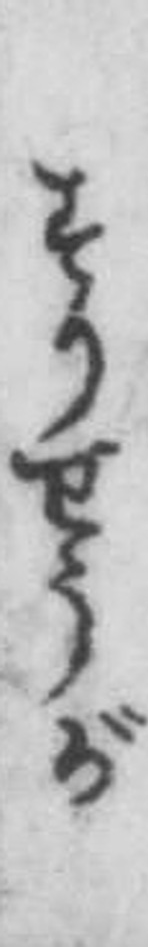くりせうが
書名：当世料理筌
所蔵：大阪府立大学学術情報センター 国文学研究資料館
